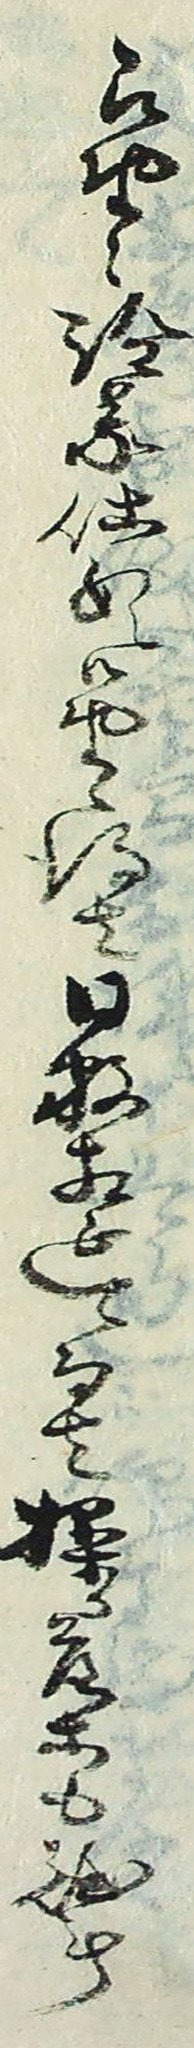即坐之詮義仕義ニ御坐候得者日数相延候而者操り落等も難計
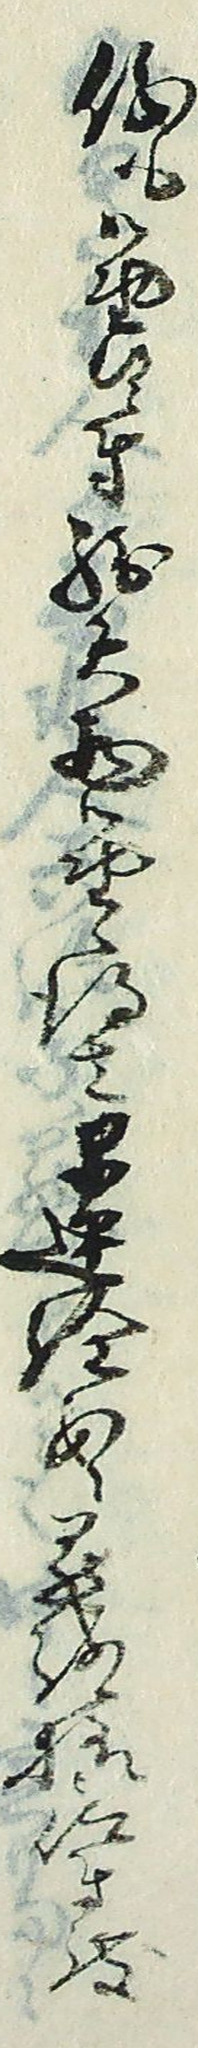儀も御坐候ニ付紛失物御坐候得者早速詮義ニ罷越候様被仰付度
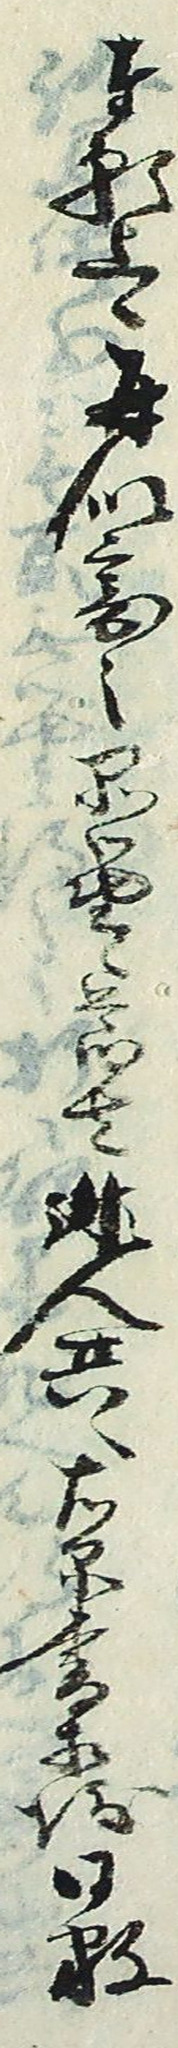奉願上候再似寄之品御坐候節者非人共へ右品書相渡日数
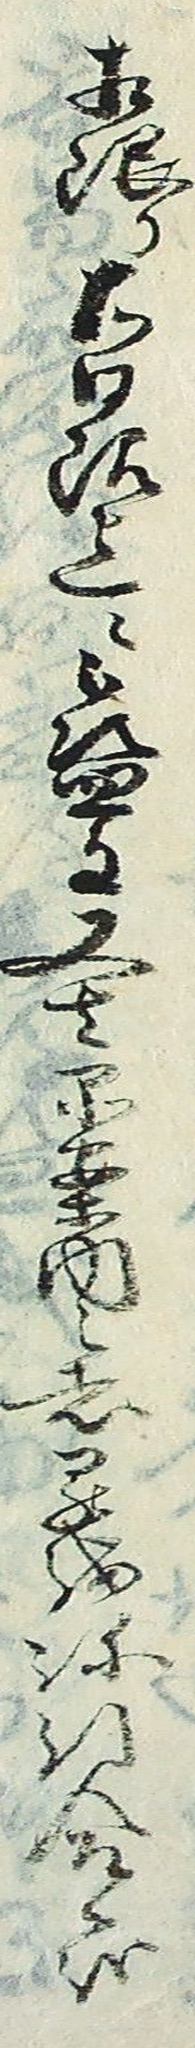相限り右日限迄ニ被盗主又者品案内之者罷越弥引合候哉
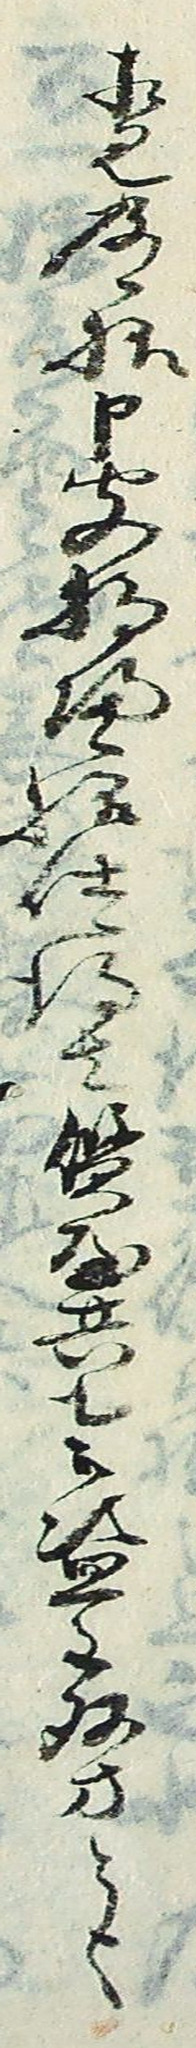相見及候様申聞持帰候様仕候得者質屋共も被盗主双方とも
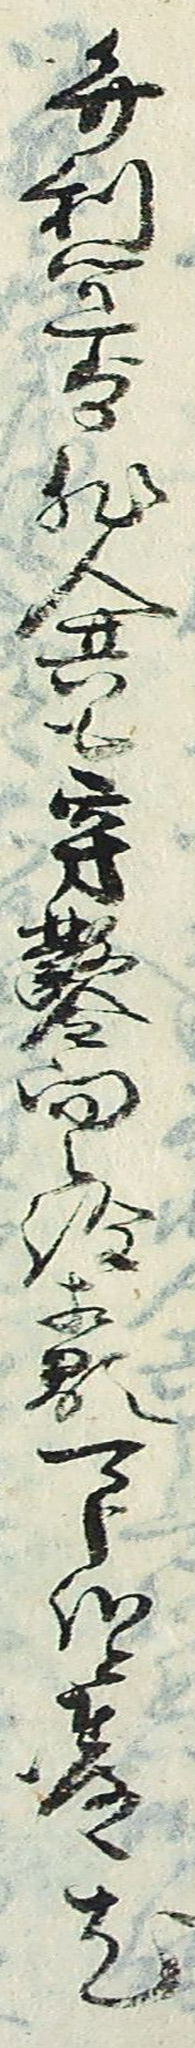弁利宜布然人共も穿鑿向之詮相顕可申哉と奉存候尤
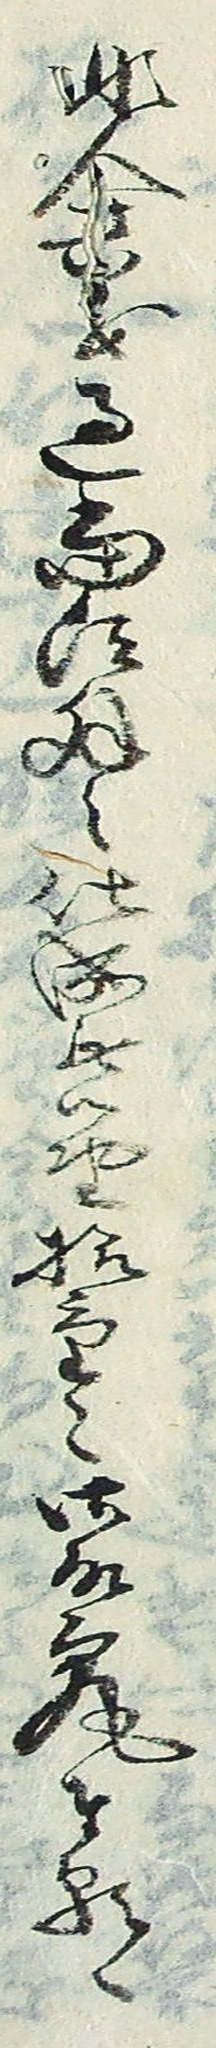非人共義通當法外之仕成無御坐様重々御取究奉願候

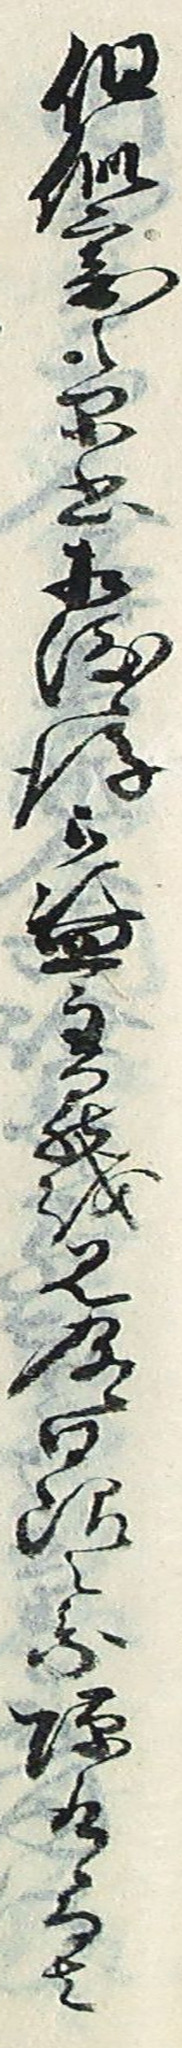但似寄之品書相渡候後被盗主罷越見及候日限之義隙取候而者
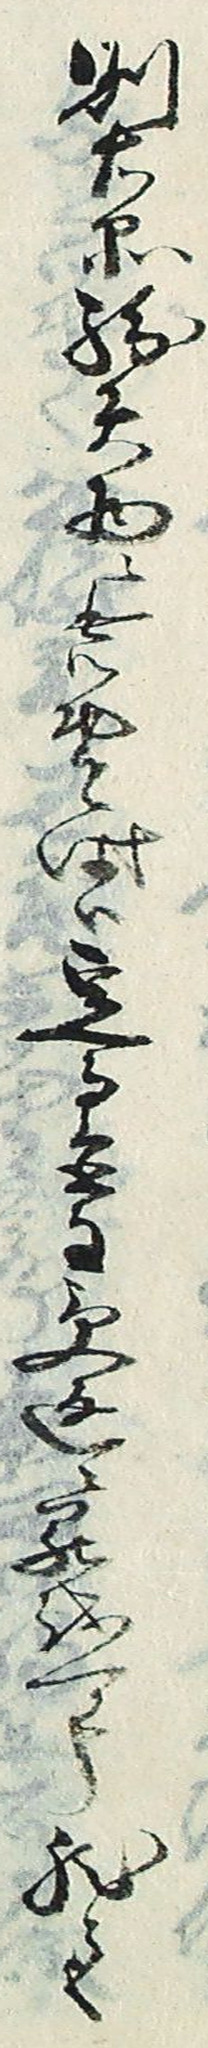則右品紛失物ニ無御坐候時ハ定而置主受返ニ罷越可申然とも
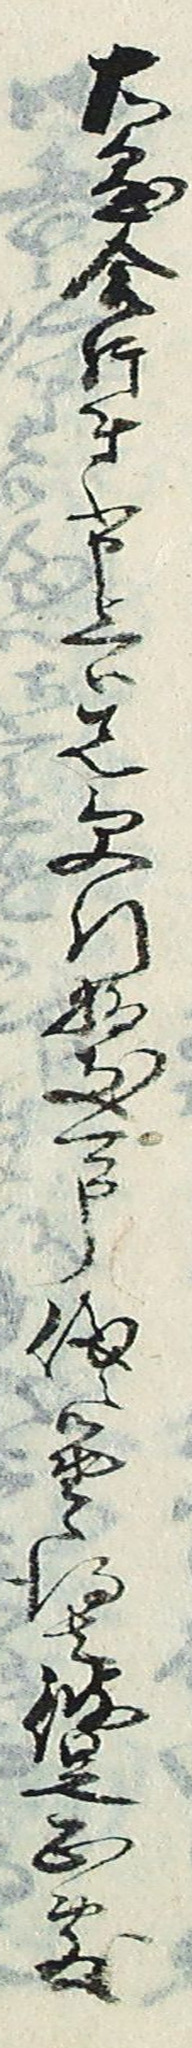右懸合行付不申上ハ先受引指支可申儀ニ御坐候得者彼是正敷
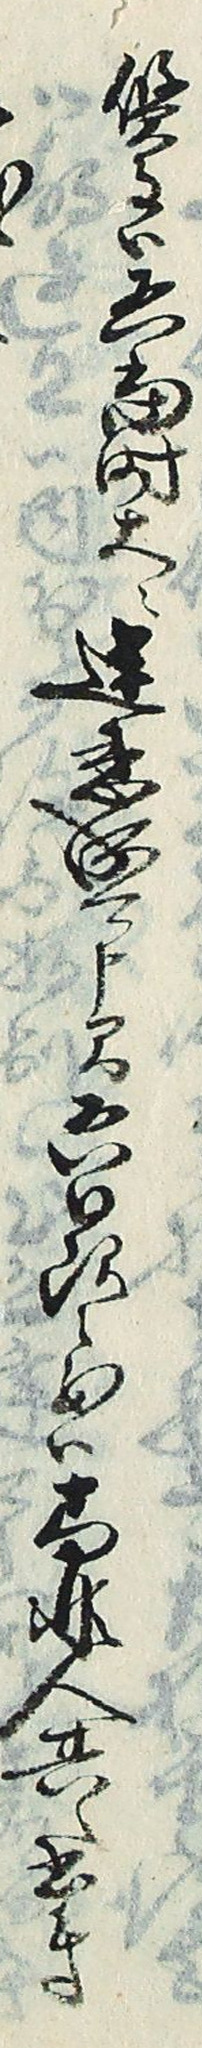質主ハ右當時大ニ迷惑成可申間右日限之義ハ番非人共へ書付
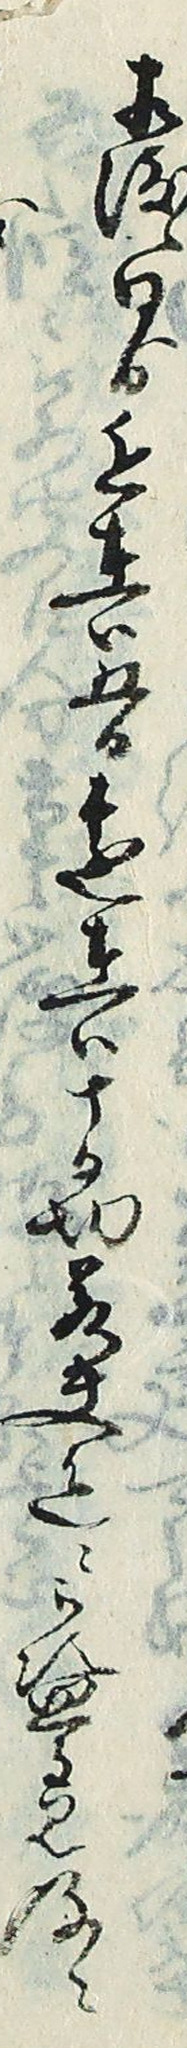相渡候日ゟ近在ハ五日遠在ハ十日切若夫迄ニ被盗主見及ニ
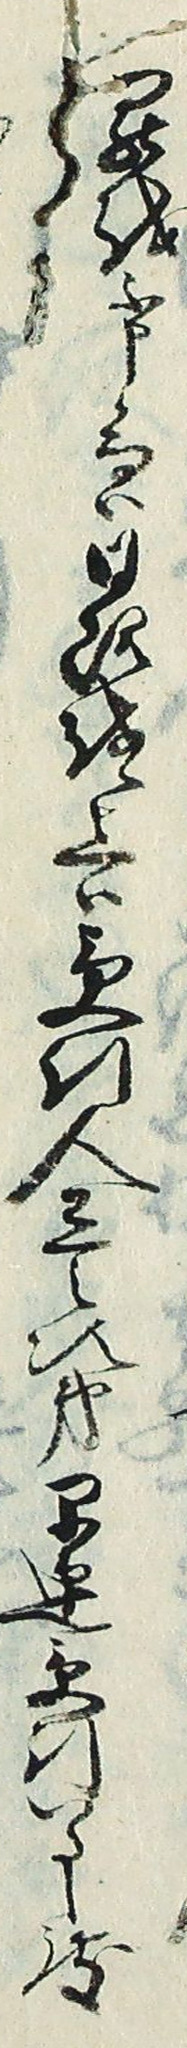罷越不申候而ハ日限越候上ハ受引人有之次第早速受引いたし度
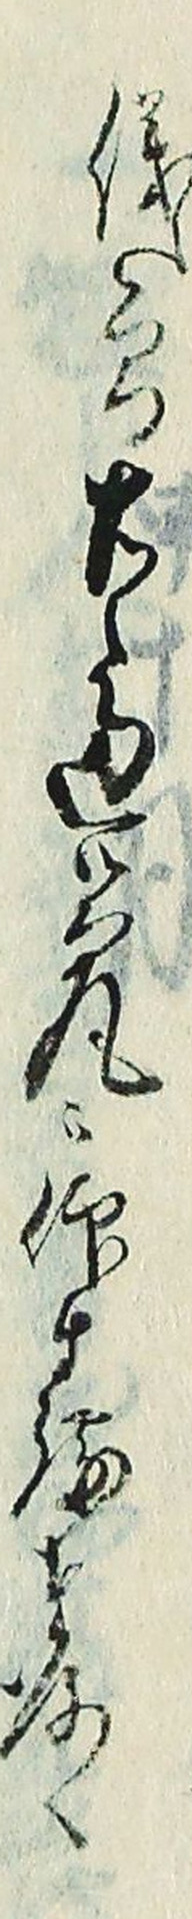儀ニ候間右之通御究被仰付度奉存候
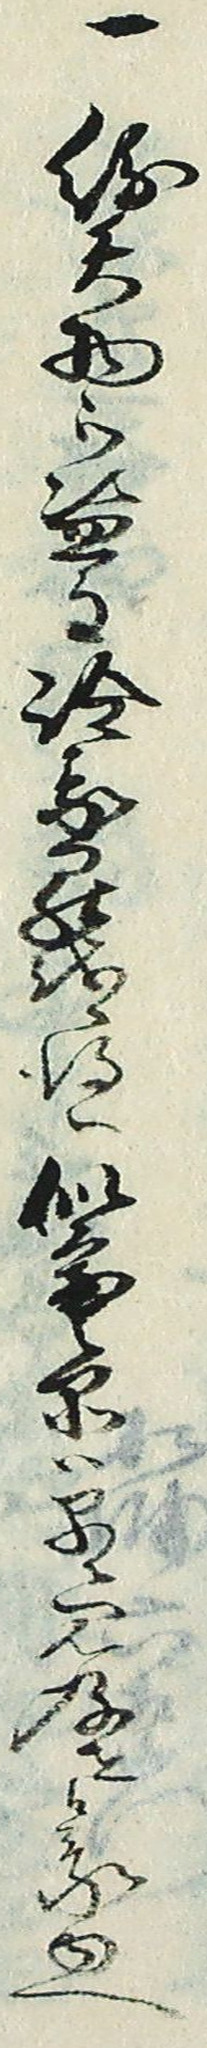一紛失物被盗主詮義罷越候得ハ似寄之品ハ早々見及せ候義ゆへ
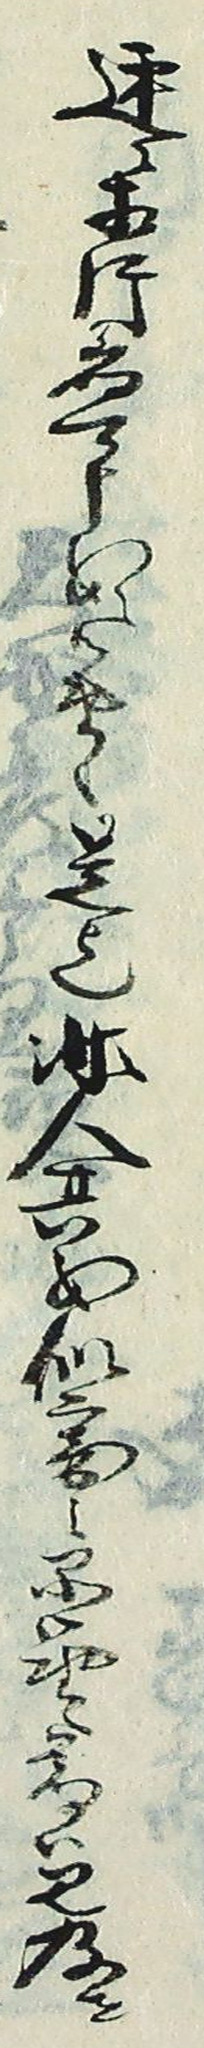速ニ相行着可申義ニ御坐候是迄非人共義似寄之品御坐候者ハ見及せ
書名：市郷質屋株御取究並御書出御趣法之写
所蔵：鳴門教育大学 Naruto University of Education
